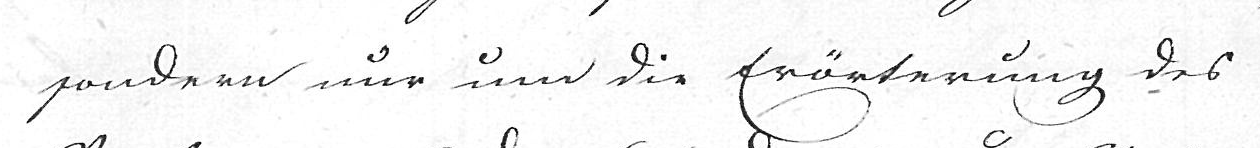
sondern nur um die Erörterung des
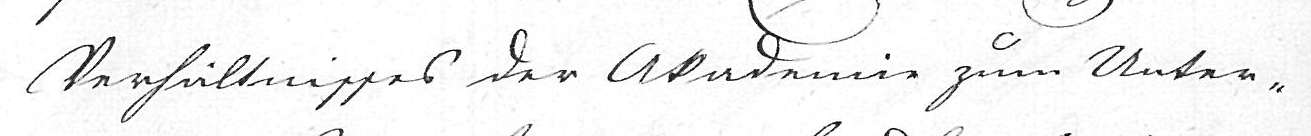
Verhältnisses der Akademie zum Unter-
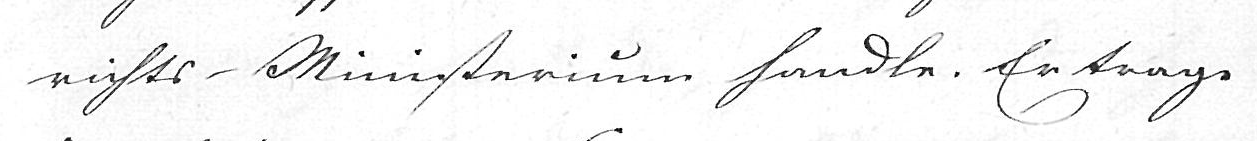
richts-Ministerium handle. Er trage
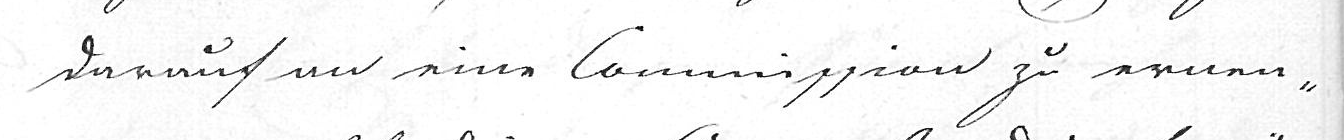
darauf an eine Commission zu ernen-
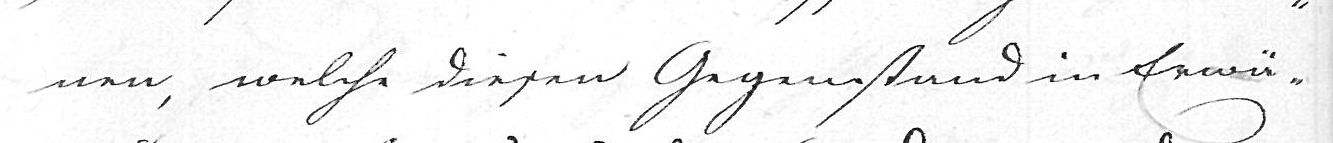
nen, welche diesen Gegenstand in Erwä-
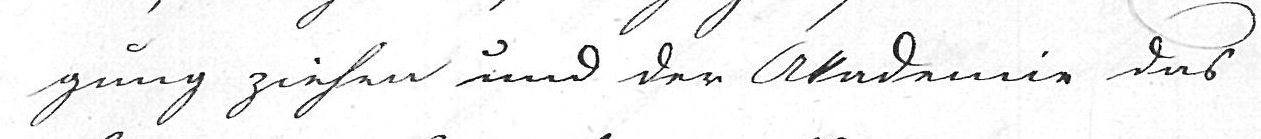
gung ziehen und der Akademie das
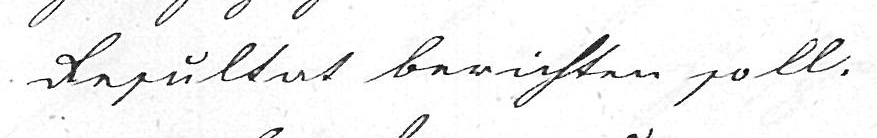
Resultat berichten soll.
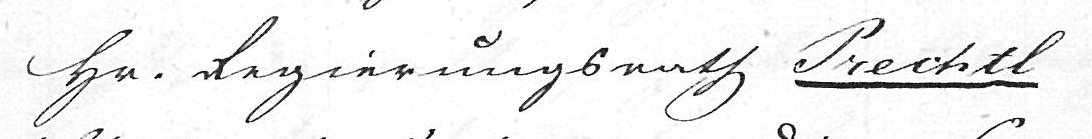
Hr. Regierungsrath Prechtl
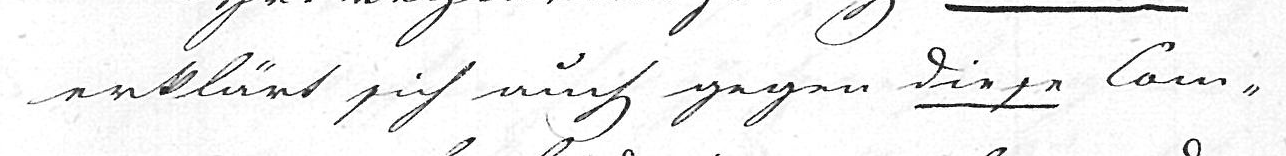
erklärt sich auch gegen diese Com-
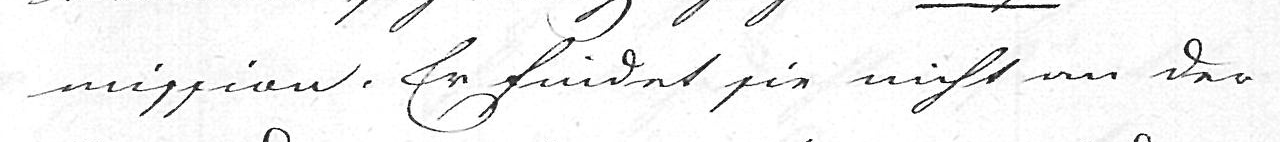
mission. Er findet sie nicht an der
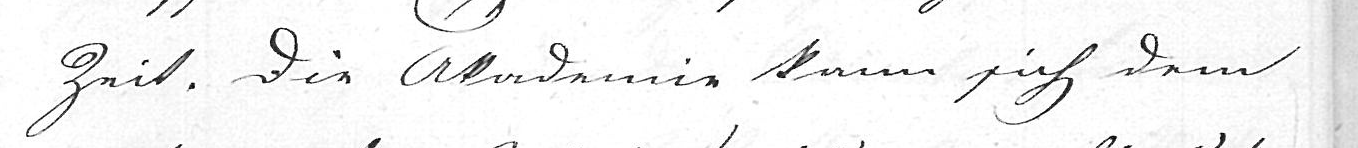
Zeit. Die Akademie kann sich dem
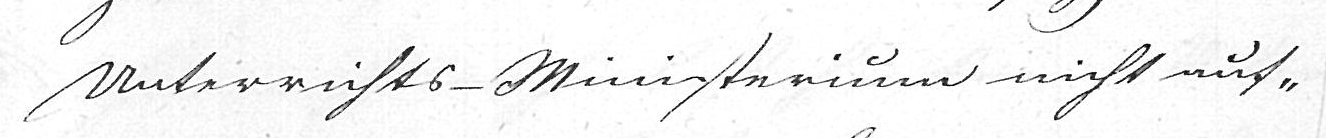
Unterrichts-Ministerium nicht auf-
